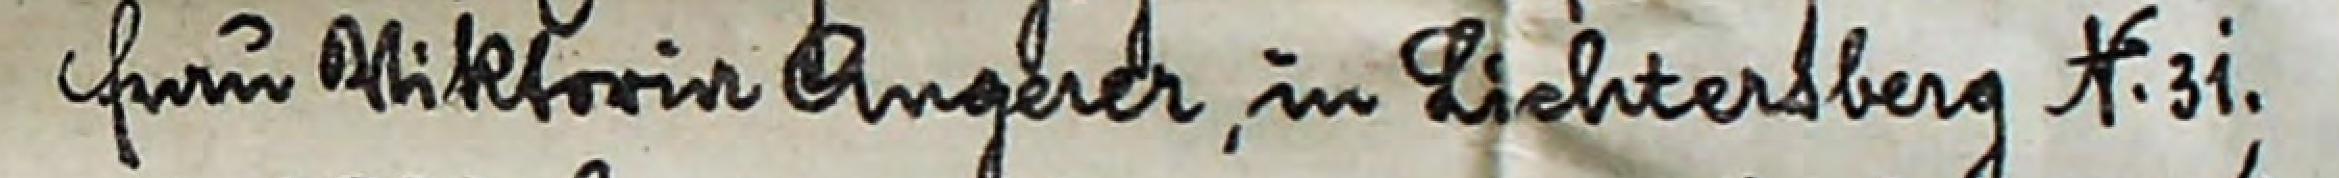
Frau Viktoria Angerer, in Lichtersberg № 31;
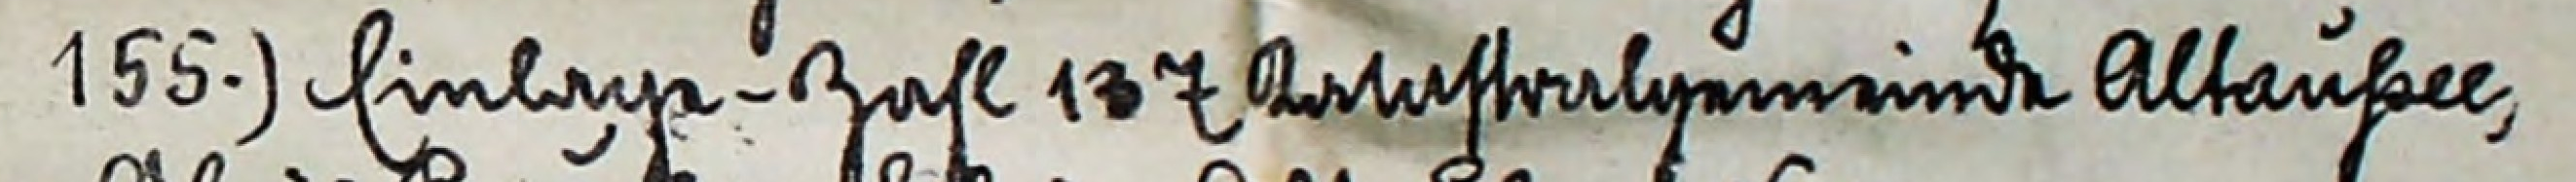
155.) Einlage - Zahl 137 Katastralgemeinde Altaussee,
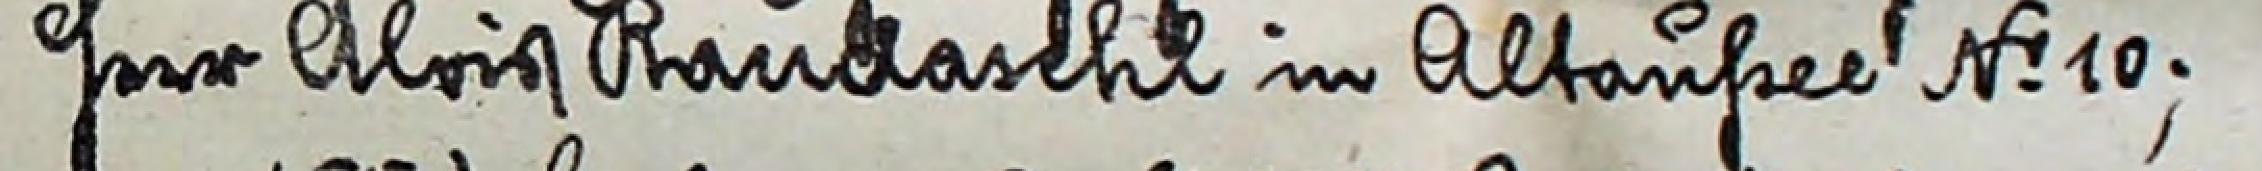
Herr Alois Raudaschl in Altaussee № 10;
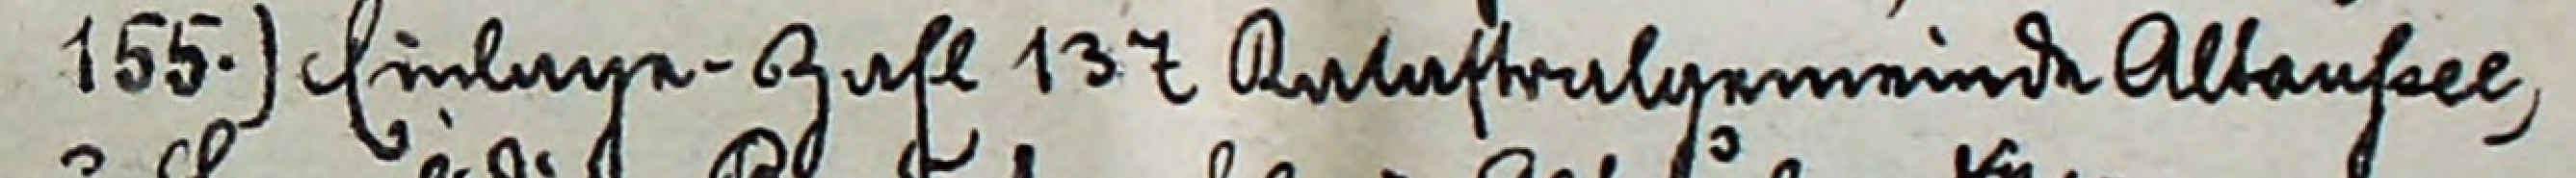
155.) Einlage - Zahl 137 Katastralgemeinde Altaussee,
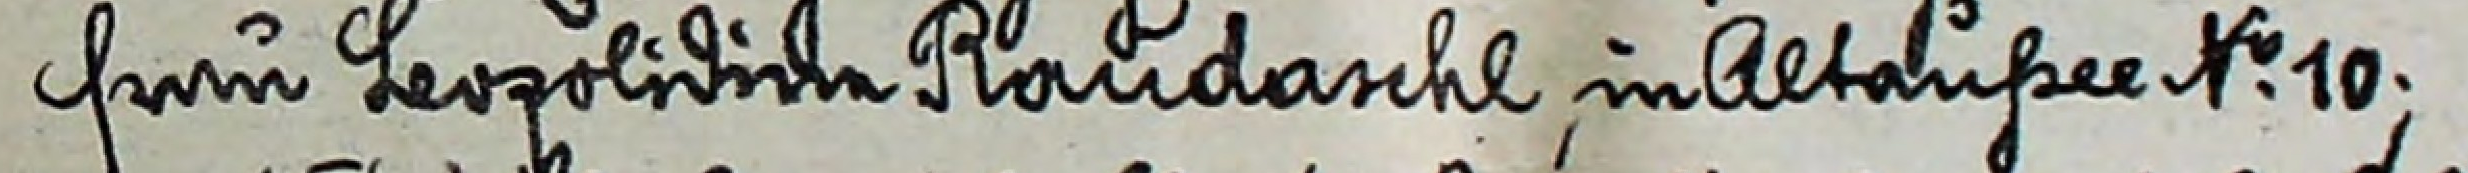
Frau Leopolidine Raudaschl, in Altaussee № 10;
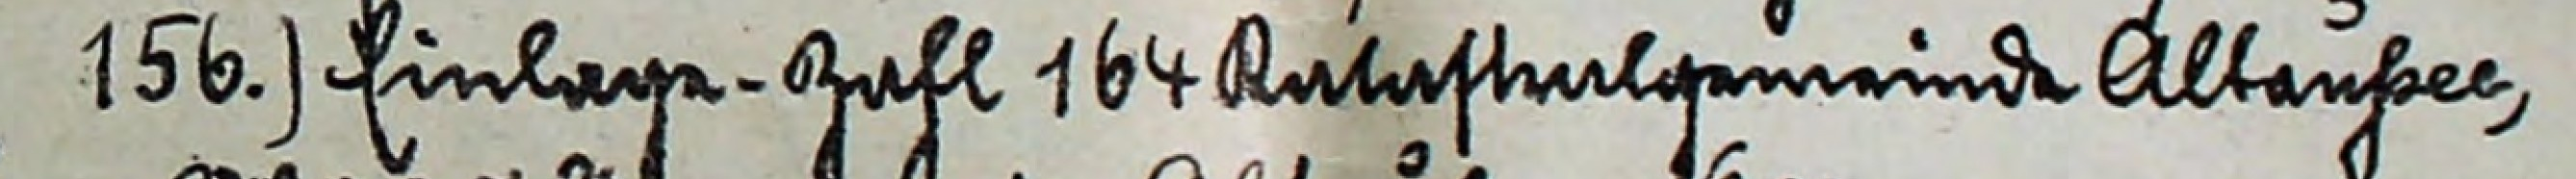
156.) Einlage - Zahl 164 Katastralgemeinde Altaussee,
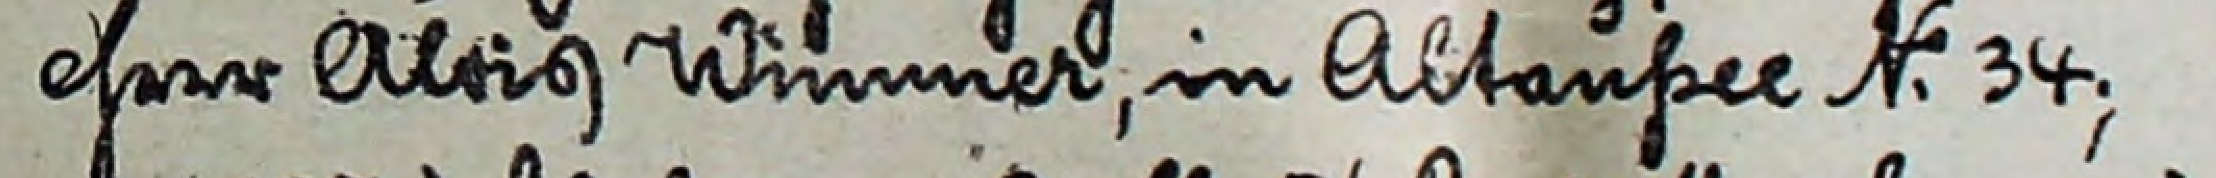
Herr Alois Wimmer, in Altaussee № 34;
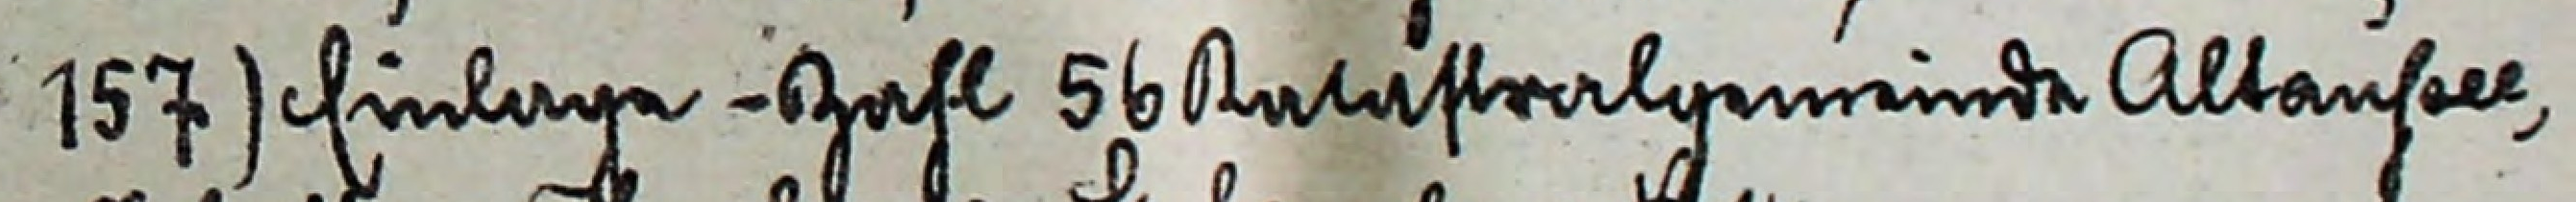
157.) Einlage - Zahl 56 Katastralgemeinde Altaussee,
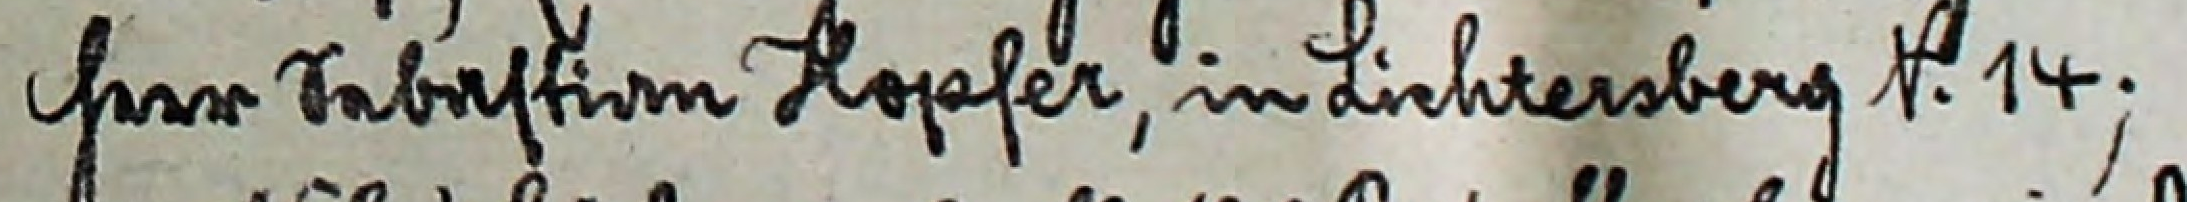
Herr Sebastian Hopfer, in Lichtersberg № 14;
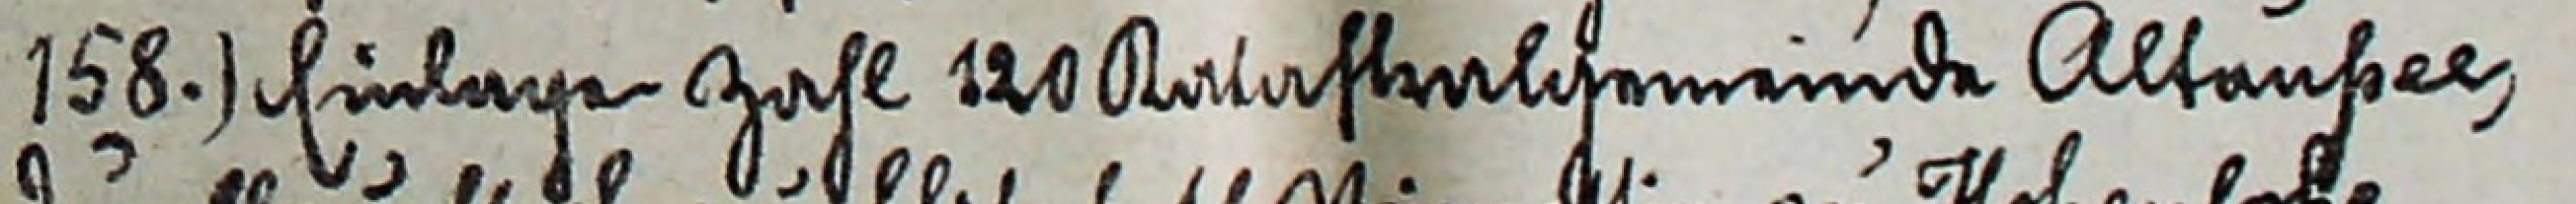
158.) Einlage - Zahl 120 Katastralgemeinde Altaussee,
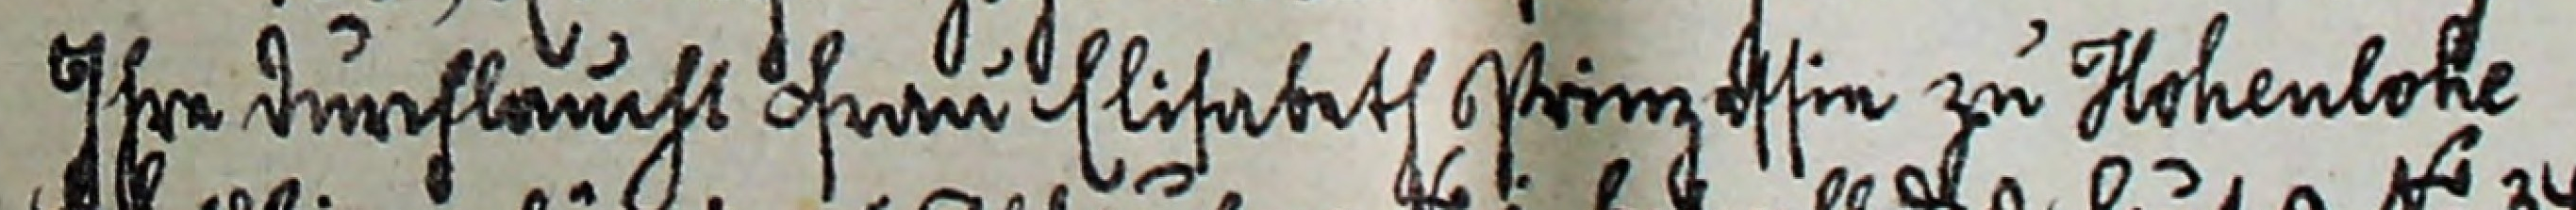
Ihre durchlaucht Frau Elisabeth Prinzessin zu Hohenlohe
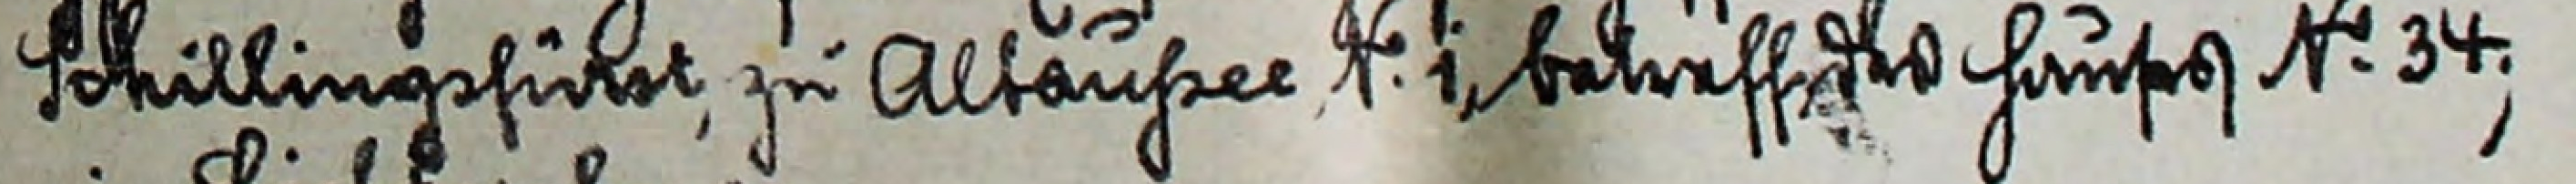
Schillingsfürst, zu Altaussee № 1, betreff des Hauses № 34;
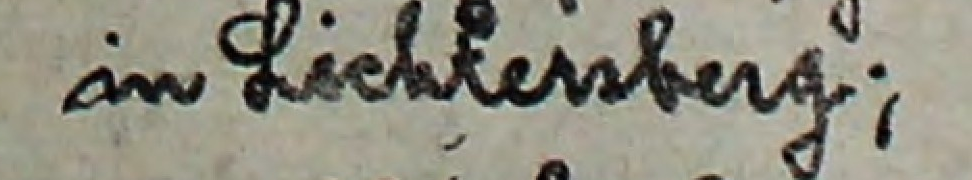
in Lichtersberg;
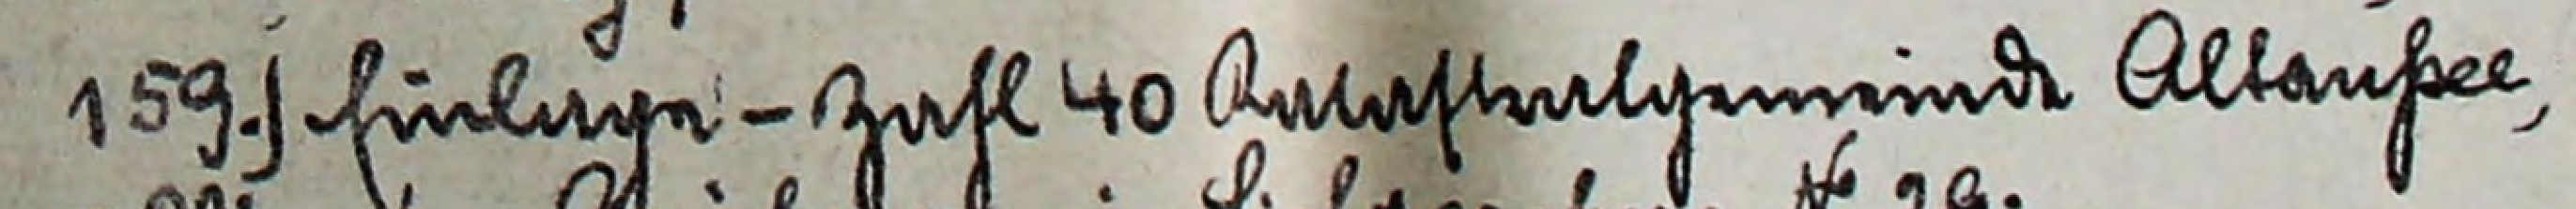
159.) Einlage - Zahl 40 Katastralgemeinde Altaussee,
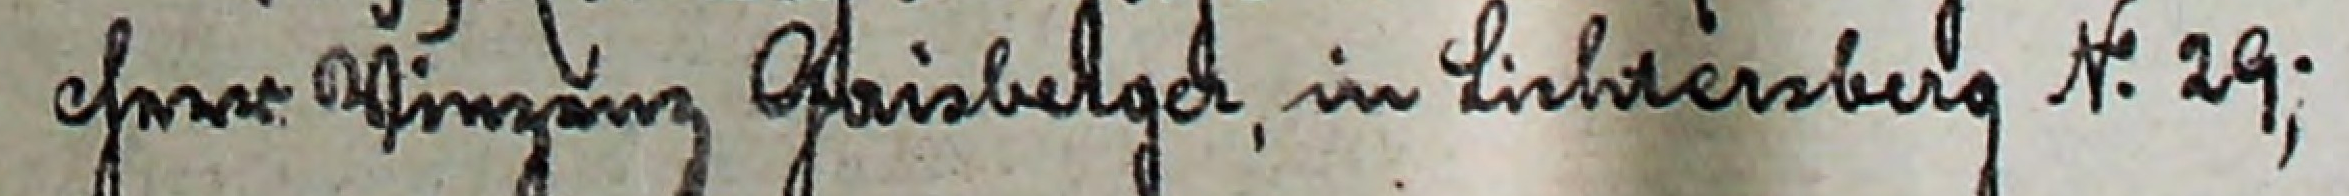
Herr Vinzenz Gaisberger, in Lichtersberg № 29;
